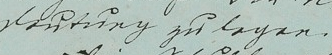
deutung zu legen.
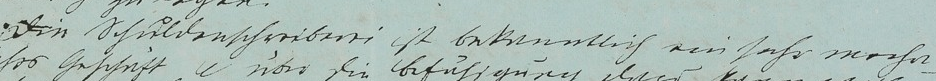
Die Schuldenschreiberei ist bekanntlich ein sehr mecha-
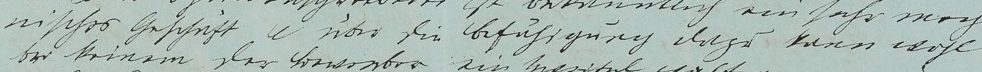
nisches Geschäft & über die Befähigung dazu kann wohl
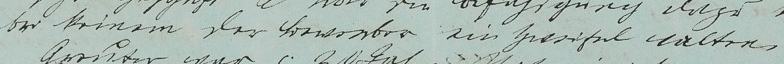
bei keinem der Bewerber ein Zweifel walten.
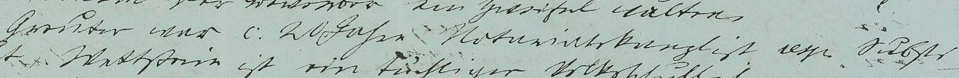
Greuter war c. 20 Jahre Notariatskanzlist resp. Substi-
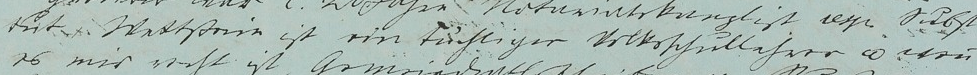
tut.Wettstein ist ein tüchtiger Volksschullehrer u wenn
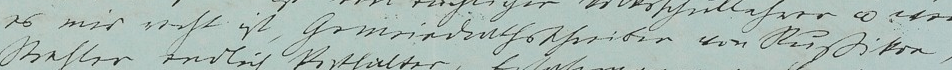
es mir recht ist, Gemeindrathsschreiber von Rußikon,
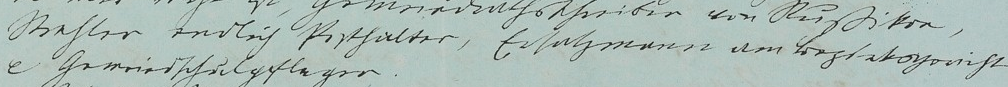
Strehler endlich Posthalter, Ersatzmann am Bezirksgericht
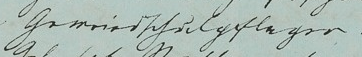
Gemeindschulpfleger.
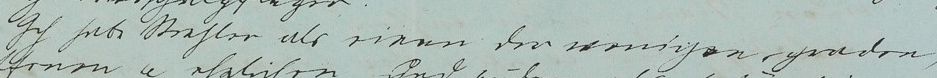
Ich habe Strehler als einen der wenigen graden,
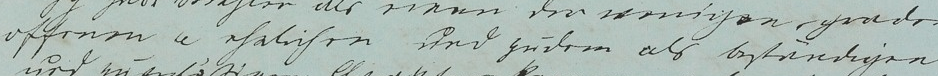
offenen & ehrlichen und zudem als beständigen
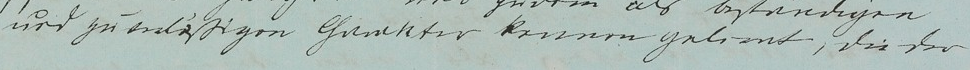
und zuverläßigen Charakter kennen gelernt, die der
